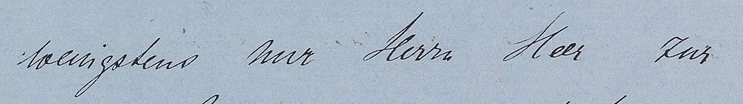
wenigstens nur Herrn Heer zur
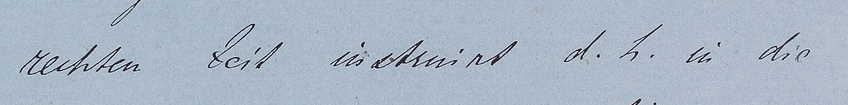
rechten Zeit instruirt d. h. in die
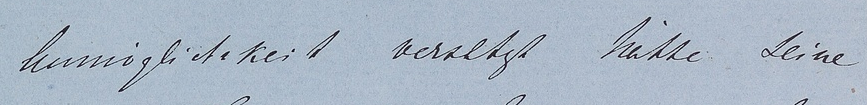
Unmöglichkeit versetzt hätte seine
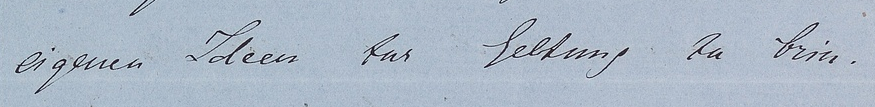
eigenen Ideen zur Geltung zu brin-
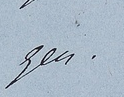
gen.
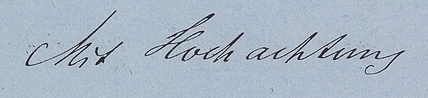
Mit Hochachtung u
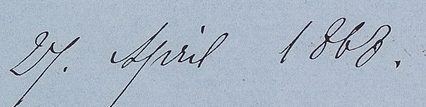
27. April 1868.
